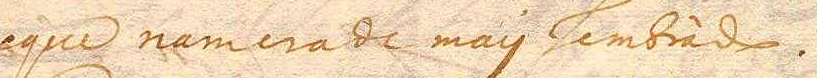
e que nam era de mais Lembrádo.
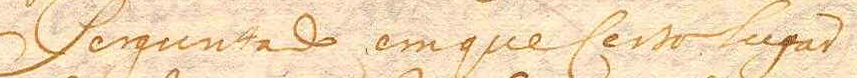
Perguntado em que Certo Lugar
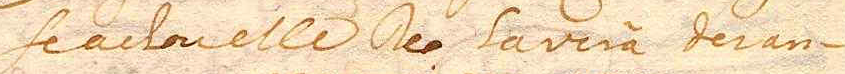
se achou elle Reo haverá dez an
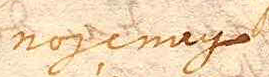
nos, e meyo
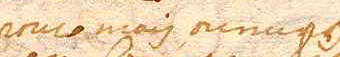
pouco mais, ou menos
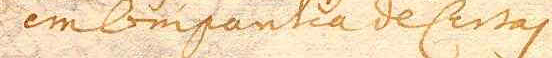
em Companhia de Certas
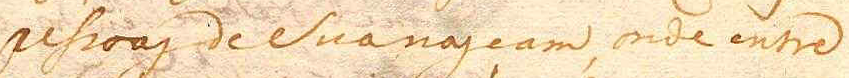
pessoas de Sua nasçam, onde entre
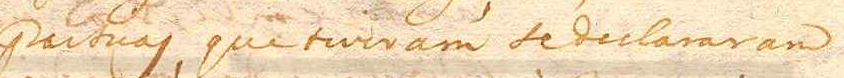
practicas, que tiveram se declararam
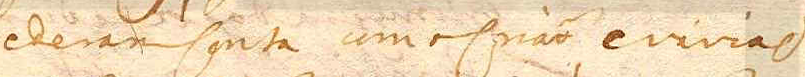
e deram Conta como Criaõ, e viviaõ
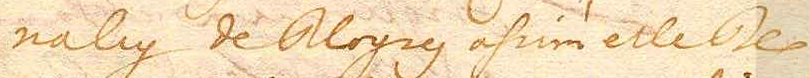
na ley de Moyzes assim elle Reo
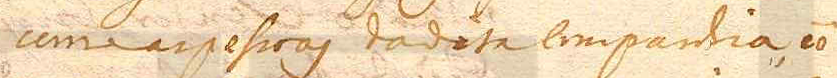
como as pessoas da dita Companhia, cō
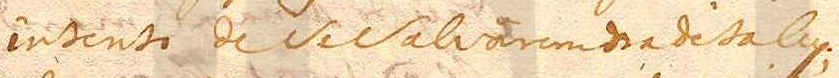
īntento de se Salvarem na dita ley,
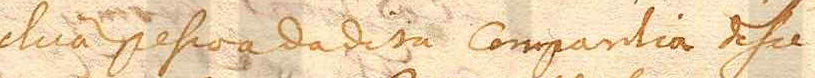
e huā pessoa da dita Companhia disse
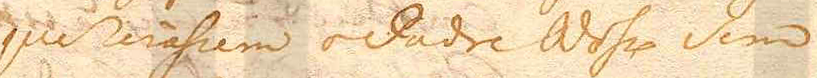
que rezassem o Padre Nosso sem
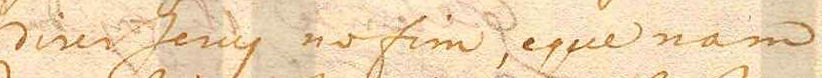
dizer Jezus no fim, e que nam
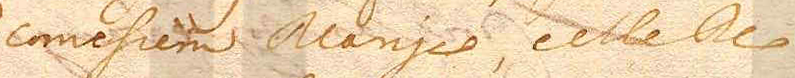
comessem Marisco, e elle Reo
